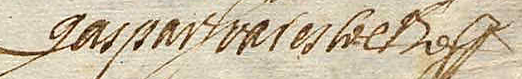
gaspar soares Coelho
